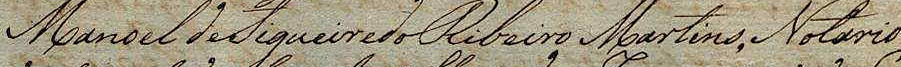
Manoel de Figueiredo Ribeiro Martins, Notario
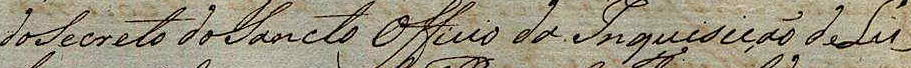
do Secreto do Sancto Officio da Inquisiçaõ de Lis
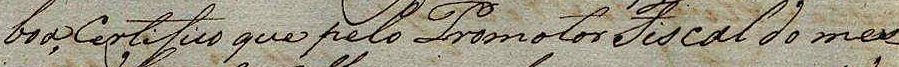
boa, certifico que pelo Promotor Fiscal do mes
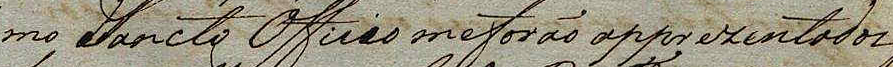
mo Sancto Officio me foraõ apprezentados
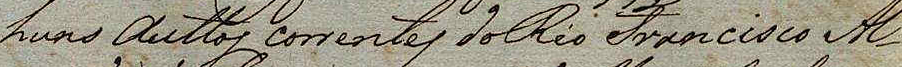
huns Auttos correntes do Réo Francisco Al
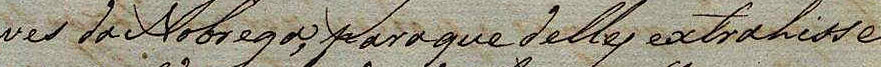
ves da Nobrega, para que delles extrahisse
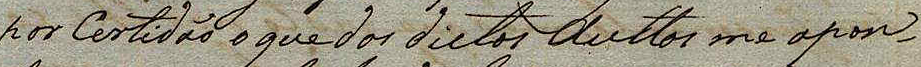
por certidaõ o que dos dictos Auttos me apon
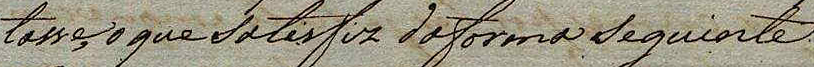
tasse, e o que satisfiz da forma seguinte.
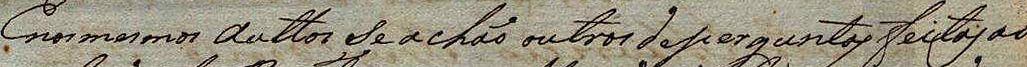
E nos mesmos Auttos se achaõ outros de perguntas feitas ao
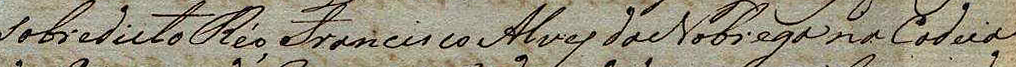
sobredicto Réo, Francisco Alves da Nobrega na Cadeia
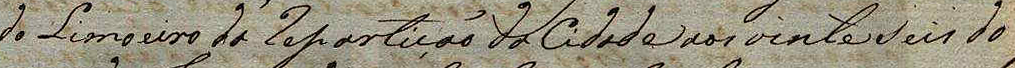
do Limoeiro da Repartiçaõ da Cidade aos vinte seis do
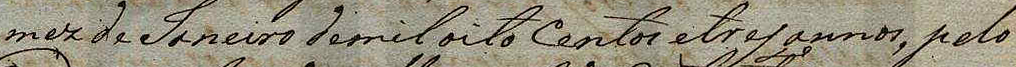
mez de Janeiro de mil oitocentos e tres annos, pelo
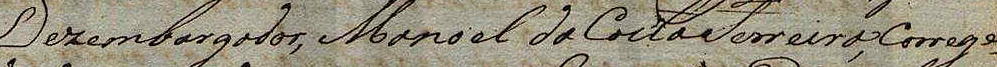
Dezembargador, Manoel da Costa Ferreira, Correge
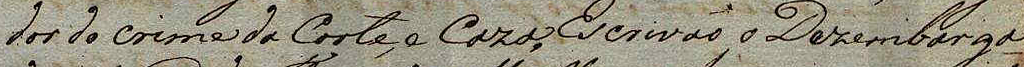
dor do crime da Corte, e Caza, Escrivaõ o Desembarga
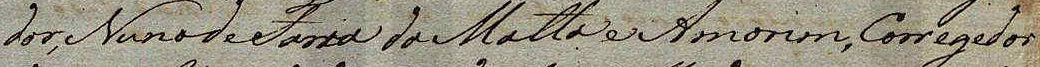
dor, Nuno de Faria da Malta e Amorim, Corregedor
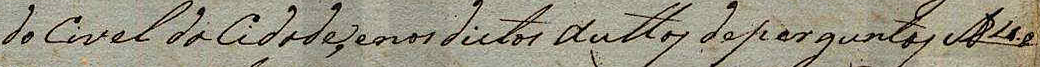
do Civel da Cidade, e nos dictos Auttos de perguntas Af 16 _
